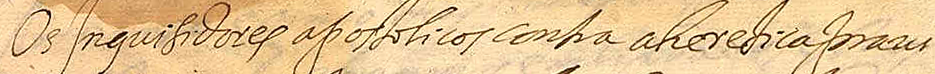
Os Jnquisidores apostolicos contra a heretica praui
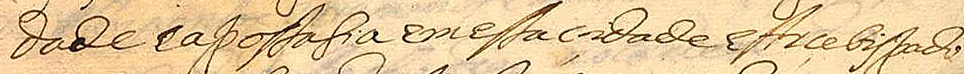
dade e apostasia Em Esta çidade E Arçebispado
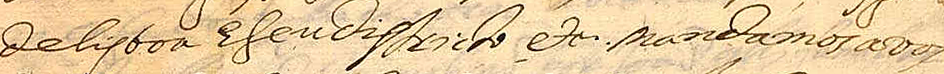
de lisboa E seu districto etc. mandamos a vos
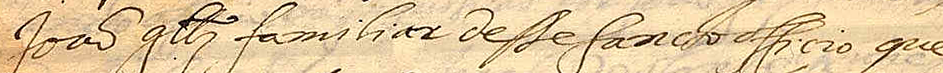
Joaõ gl̄lz familiar deste Sancto offiçio que
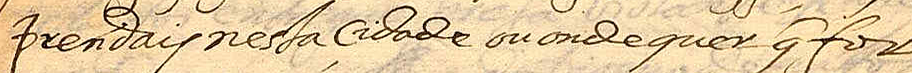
prendais nesta Çidade ou onde quer q̄ for
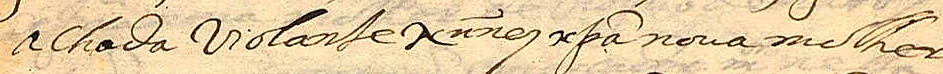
achada Violante Nun̄ez xpā noua molher
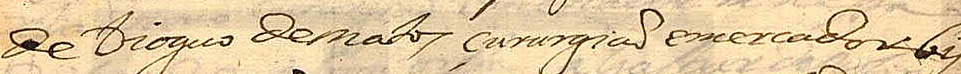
de Diogo de matos çururgiaõ E mercador bis
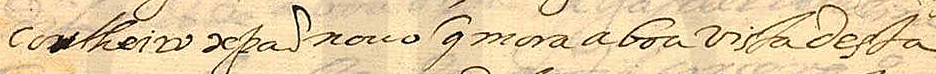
coutheiro xpaõ nouo q̄ mora a boa vista desta
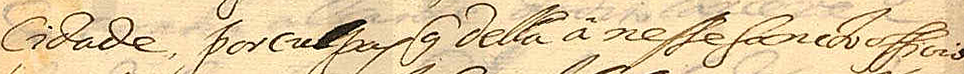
Çidade, por culpas q̄ della â neste Sancto offiçio
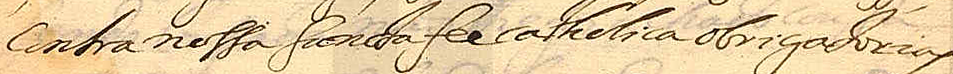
contra nossa sancta fee catholica obrigatorias
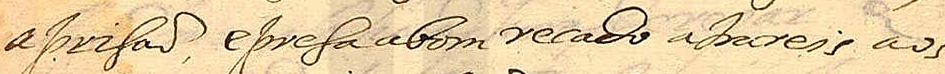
a prisaõ, e presa a bom recado a trareis aos
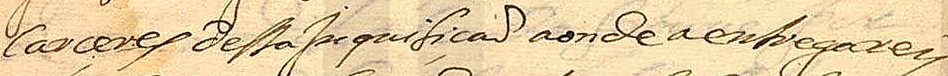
carçeres desta Jnquisição aonde a entregareis
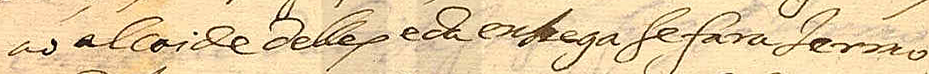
ao alcaide delles e da entrega se fara termo
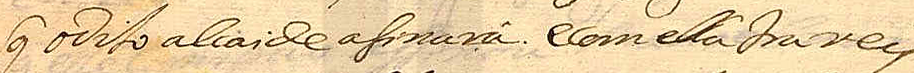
q̄ o dito alcaide asinará. E com ella trareis
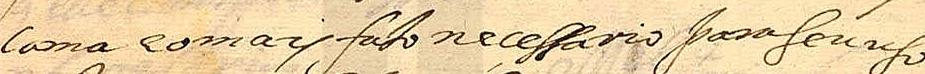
cama E o mais fato neçessario para seu uso
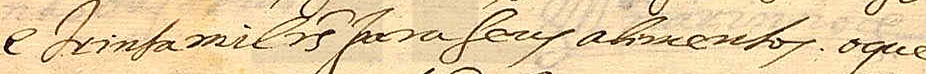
e trinta mil rs̄ para seus alimentos. o que
